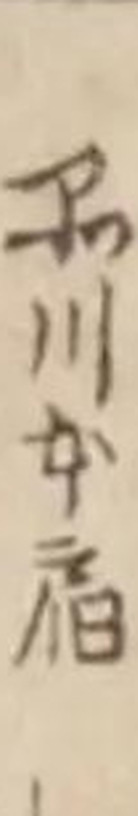品川本宿
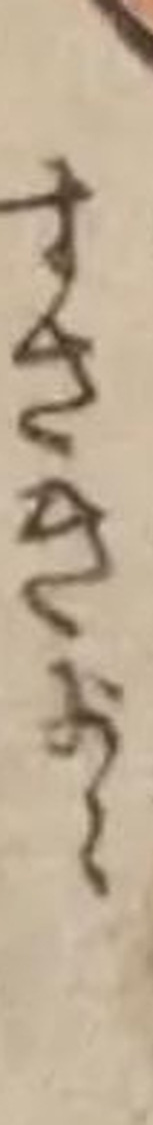すさき少し
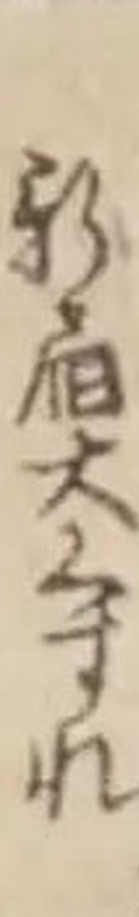新宿大くすれ
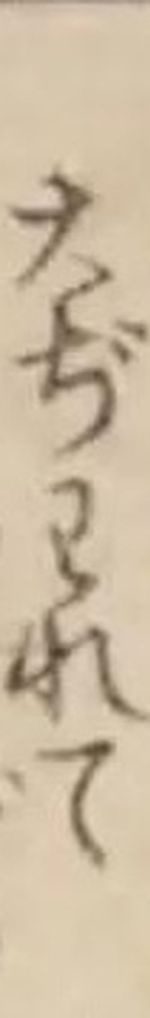大ぢわれて
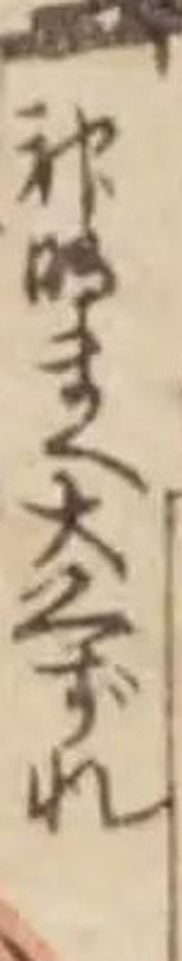神明まて大くずれ
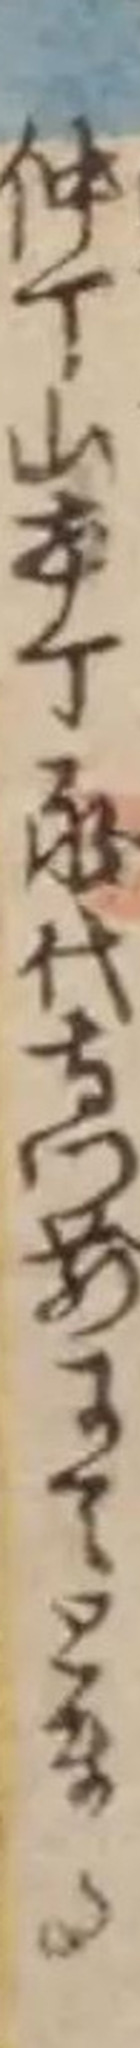仲丁山本丁取代寺門前にてとまる
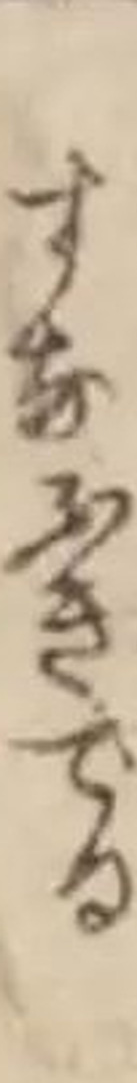すなふきでる
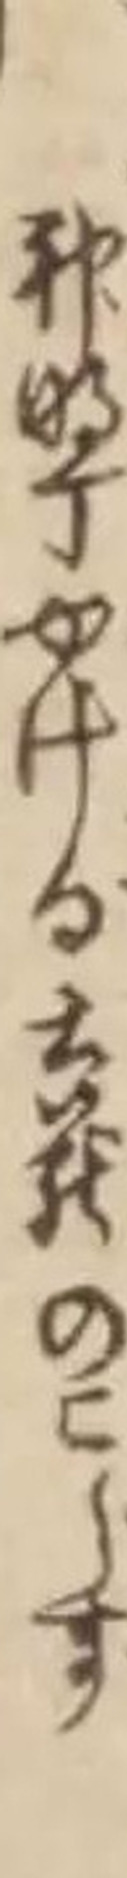神明丁やける土蔵のこらず
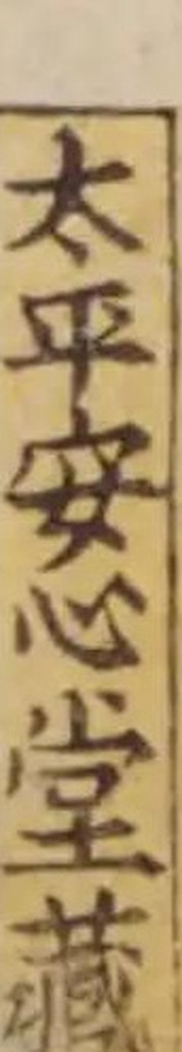太平安心堂蔵板
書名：銘細改板江戸大地震出火場所附
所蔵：国立国会図書館 National Diet Library, JAPAN
